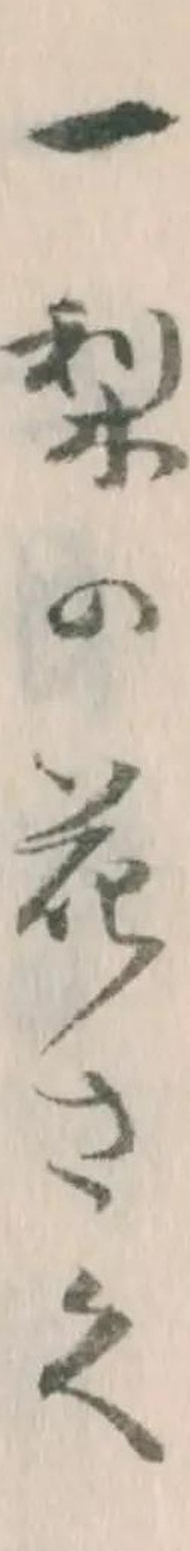一梨の花さく
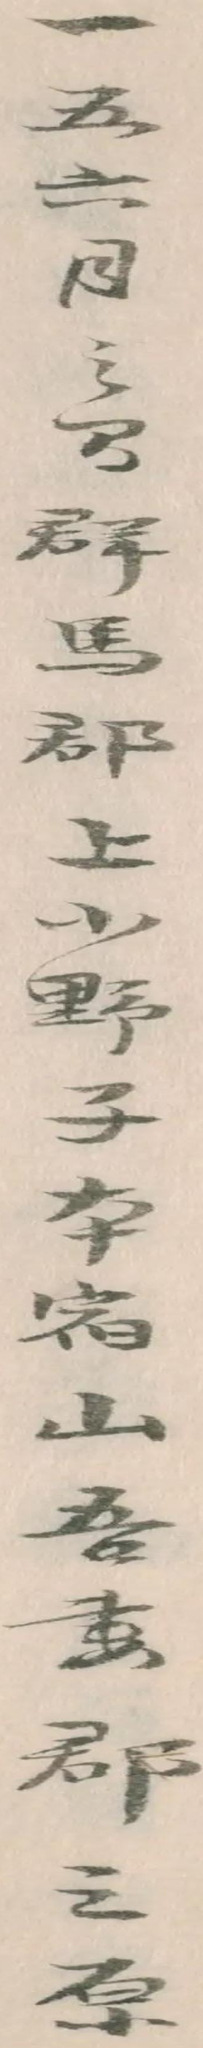一五六月之間群馬郡上小野子本宿山吾妻郡三原
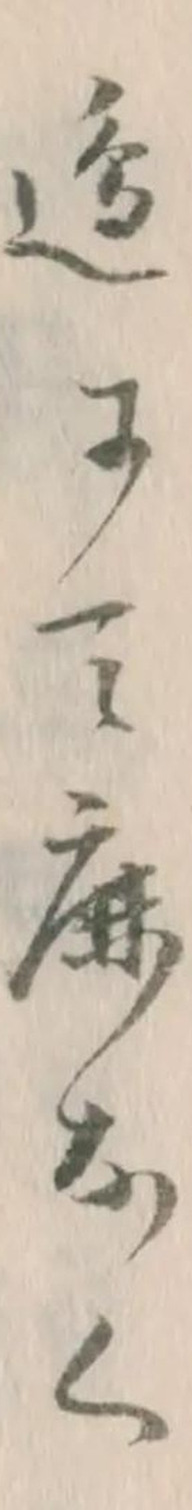辺にて鹿なく

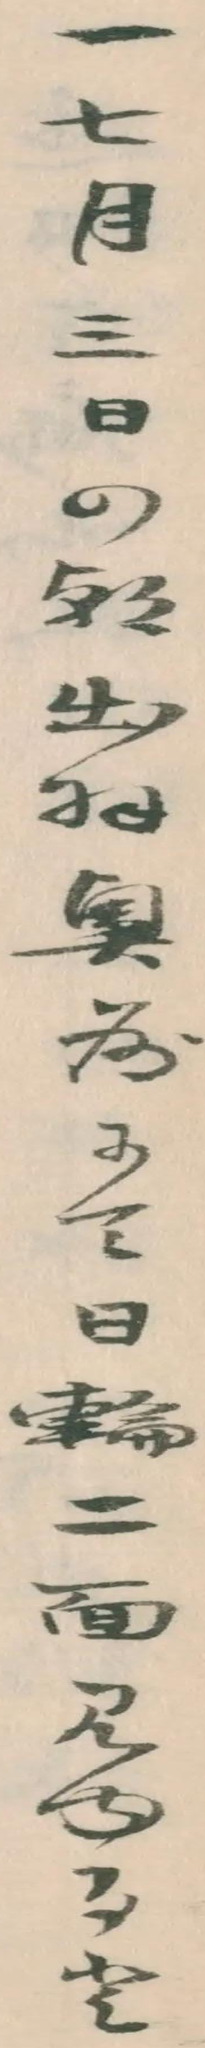一七月三日の朝出羽奥州にて日輪二面見ゆると
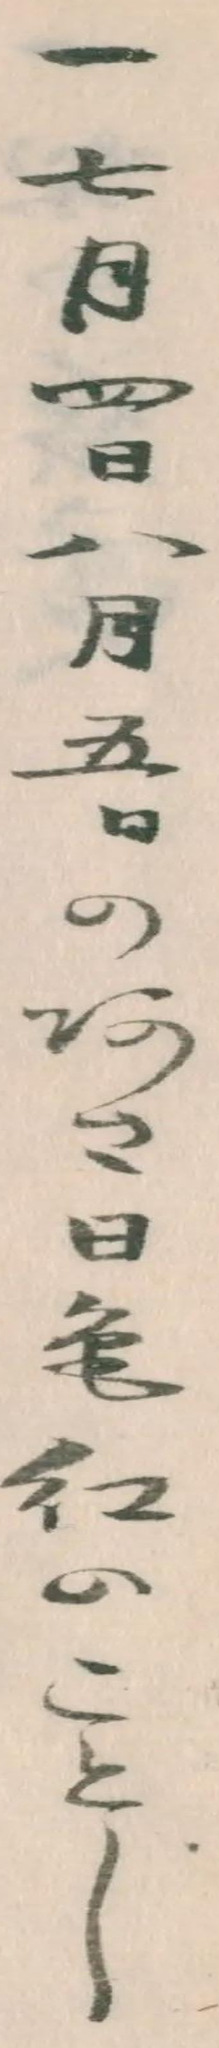一七月四日八月五日のあさ日色紅のことし
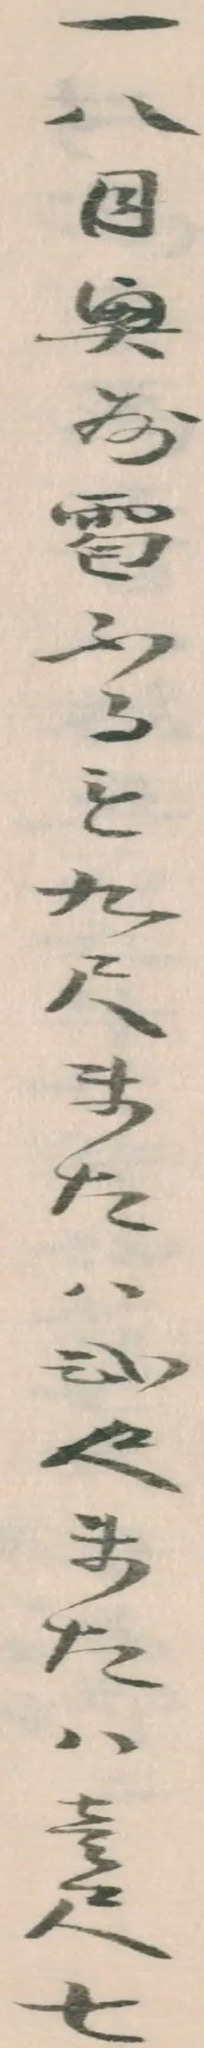一八月奥州雹ふるも九尺または弐尺または壱尺七
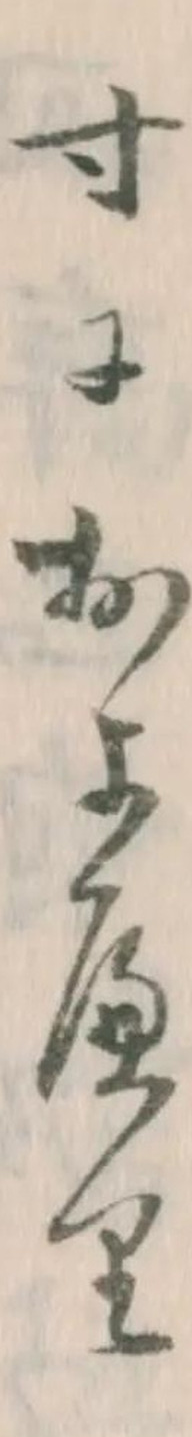寸におよへり
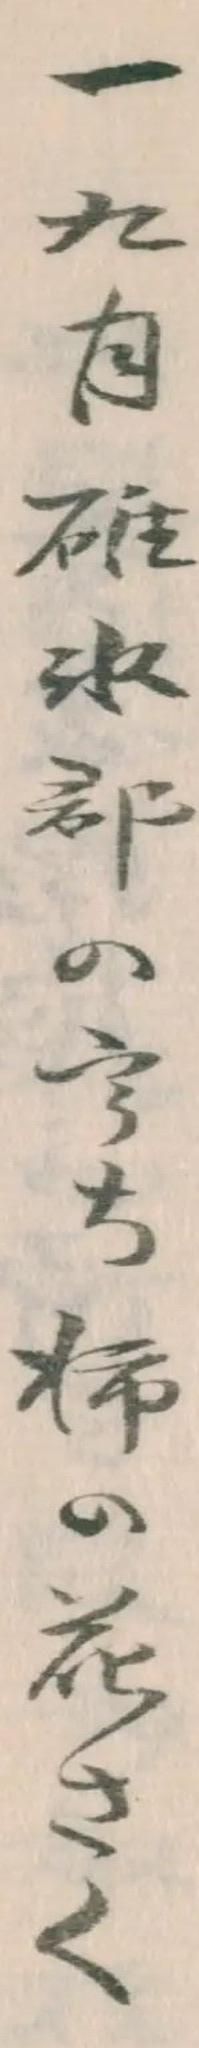一九月碓氷郡のうち柿の花さく
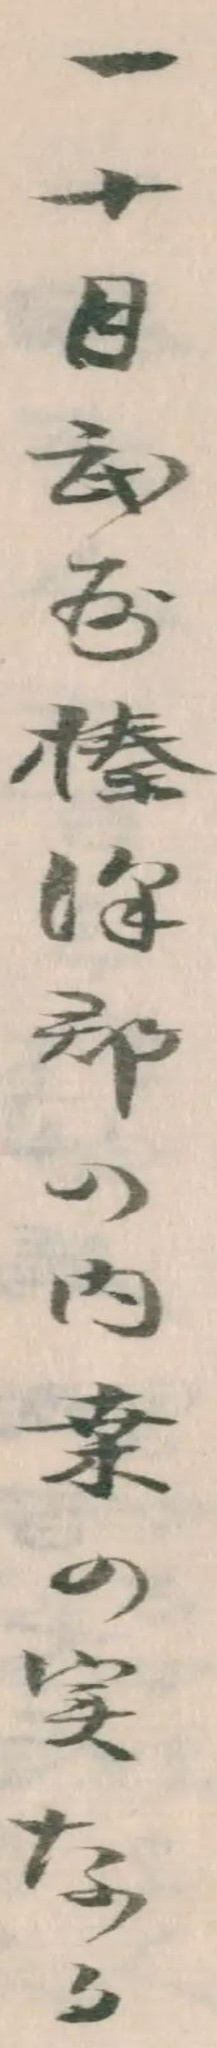一十月武州榛沢郡の内桑の実なる
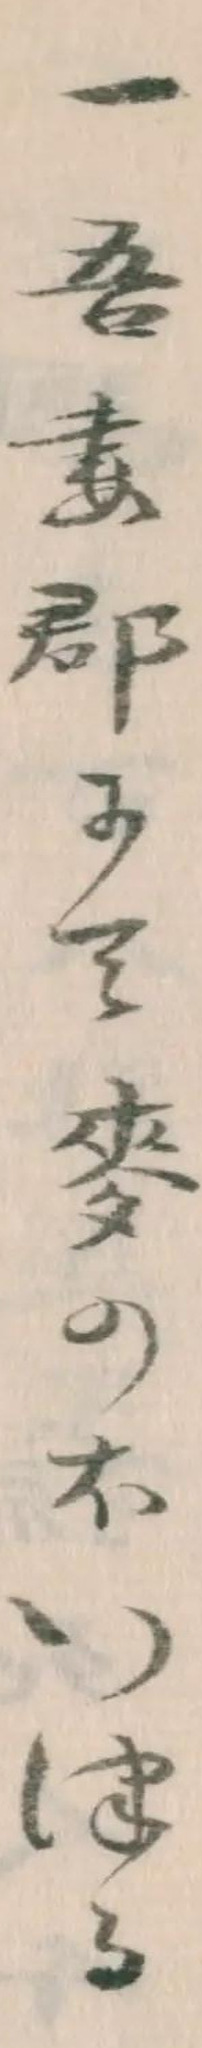一吾妻郡にて麦のほいつる
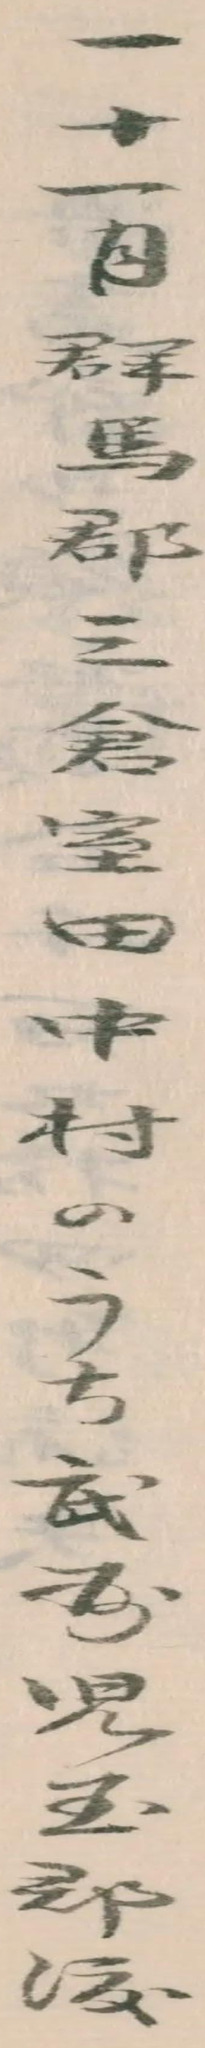一十一月群馬県三倉室田中村のうち武州児玉郡渡
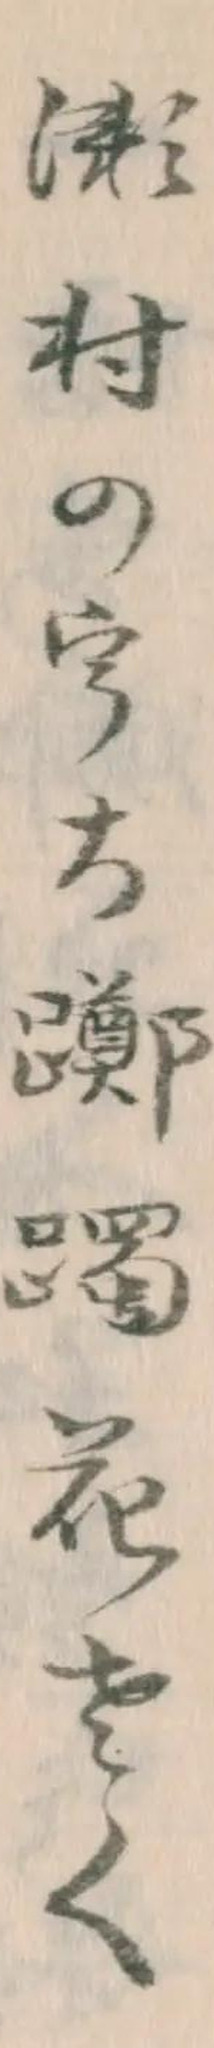瀬村のうち躑躅花さく
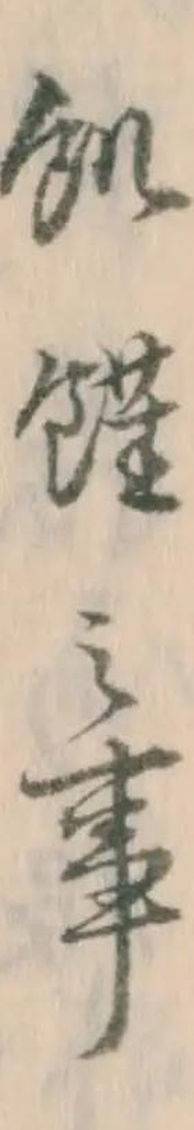飢饉の事
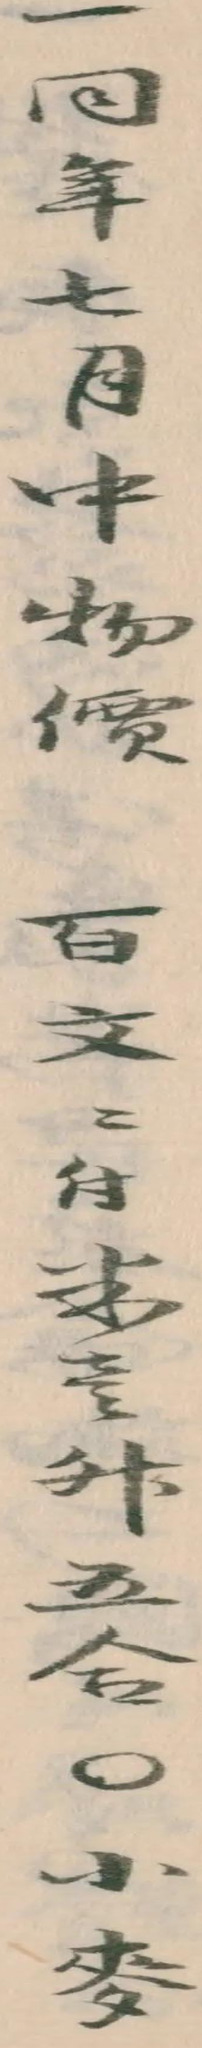一同年七月中物価百文ニ付米壱升五合〇小麦
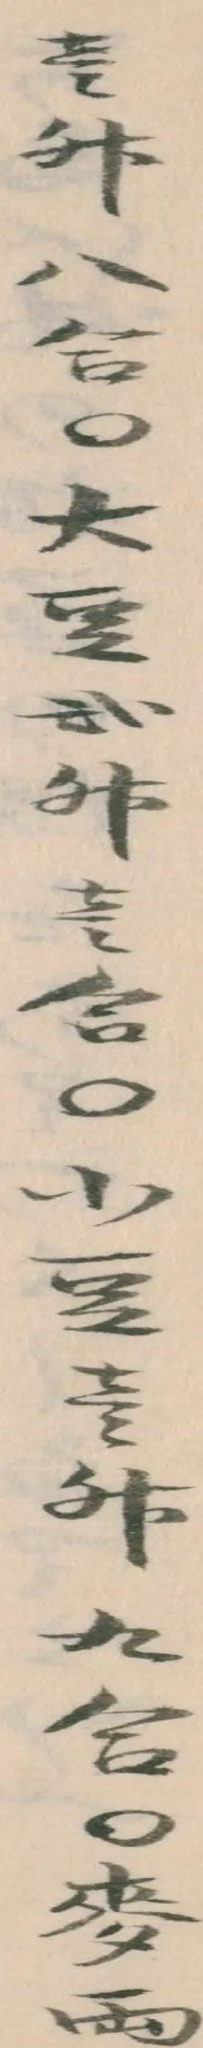壱升八合〇大豆弐升壱合〇小豆壱升九合〇麦両
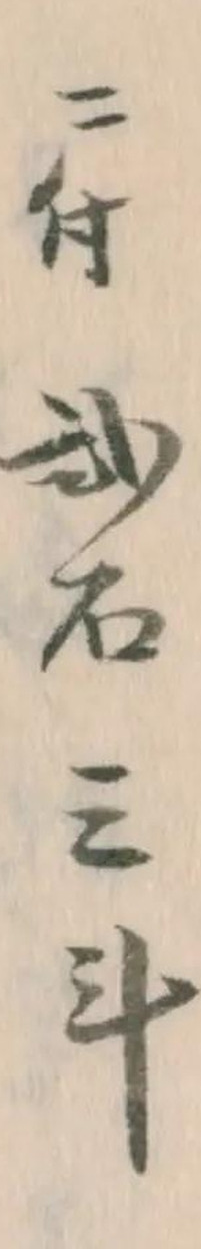ニ付弐石三斗
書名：地災撮要. 巻11-12(地震之部)
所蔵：国立国会図書館 National Diet Library, JAPAN
